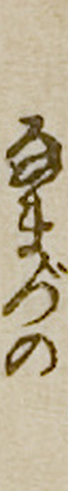なまづの
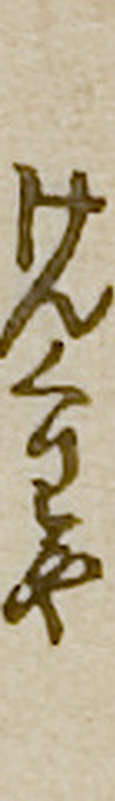けんくわや
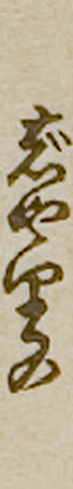じやりの
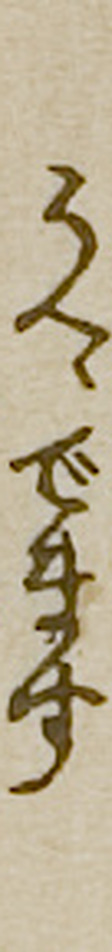うへゝでます
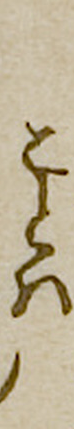ことは
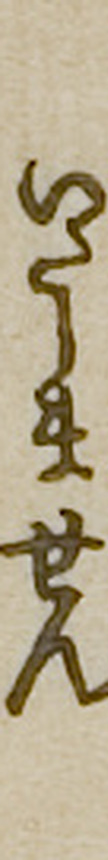いたしません
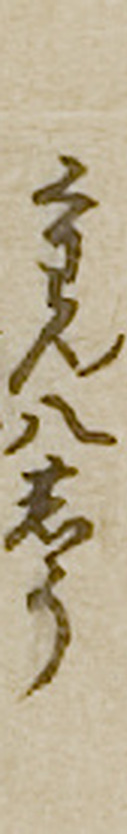くわん八しう
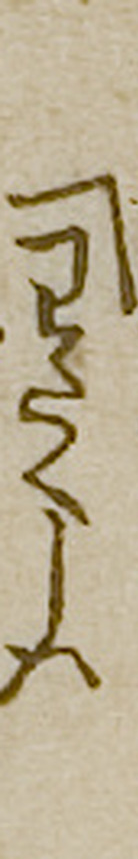「わたくしは
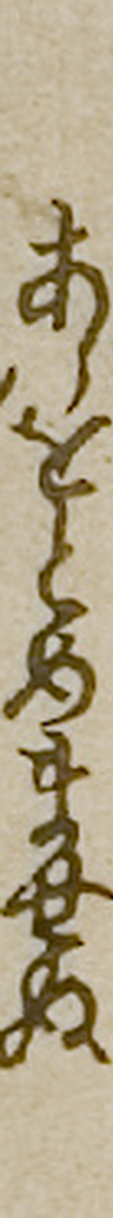あしをとめませぬ
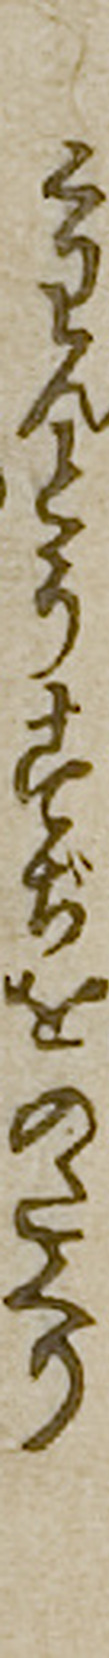くわんとうすぢをのたくり
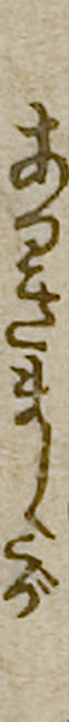あるきましたが
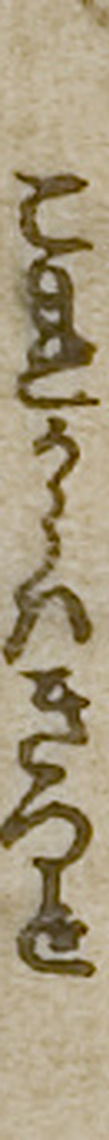これからはきつと
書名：[地震鯰の取り調べ]
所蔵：東京大学総合図書館 General Library in the University of Tokyo, JAPAN
